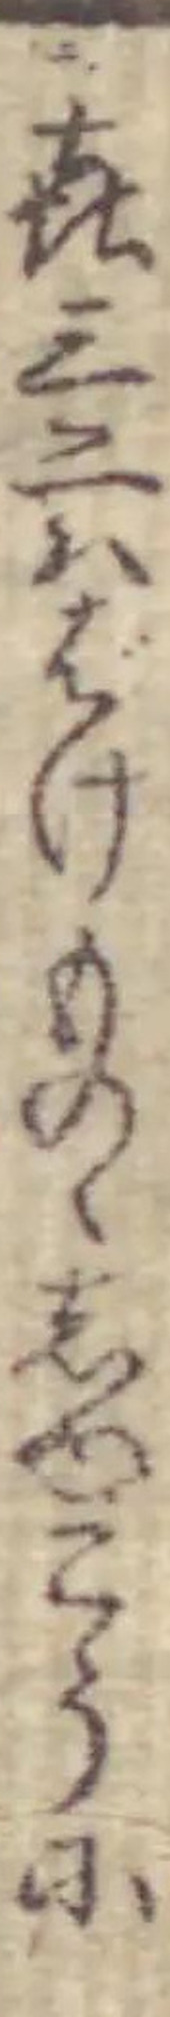喜三二はばけものゝしゆこうに
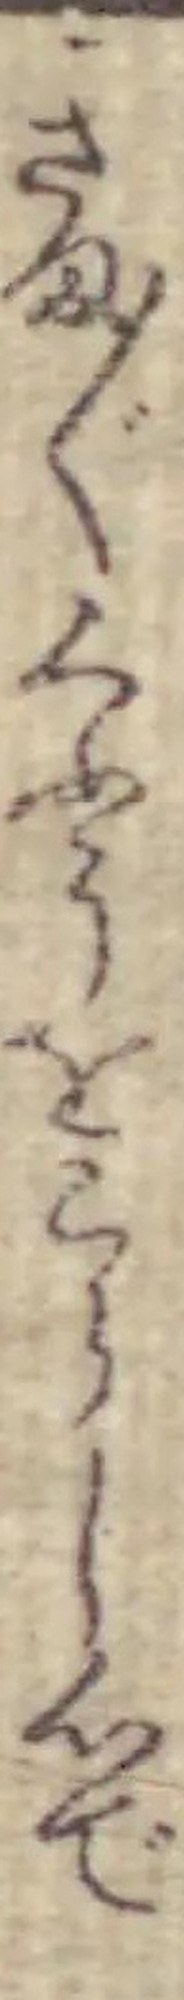さま〳〵くふうをこらし心で
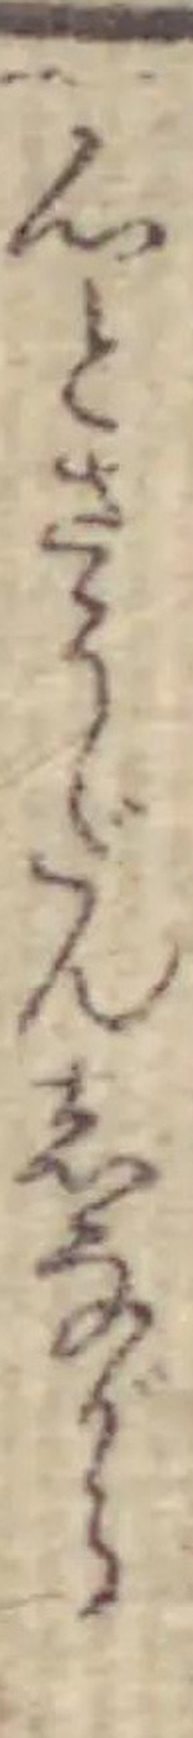心とさうだんしながら
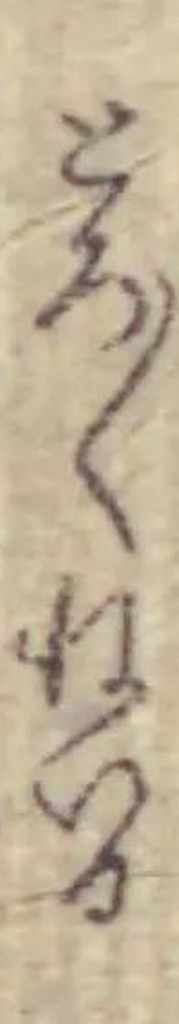とろ〳〵ねいる
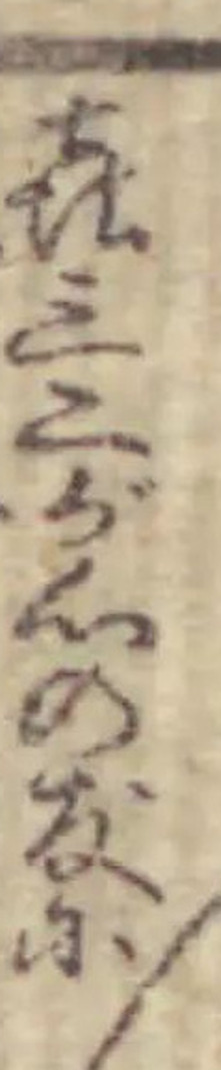喜三二が心の友に
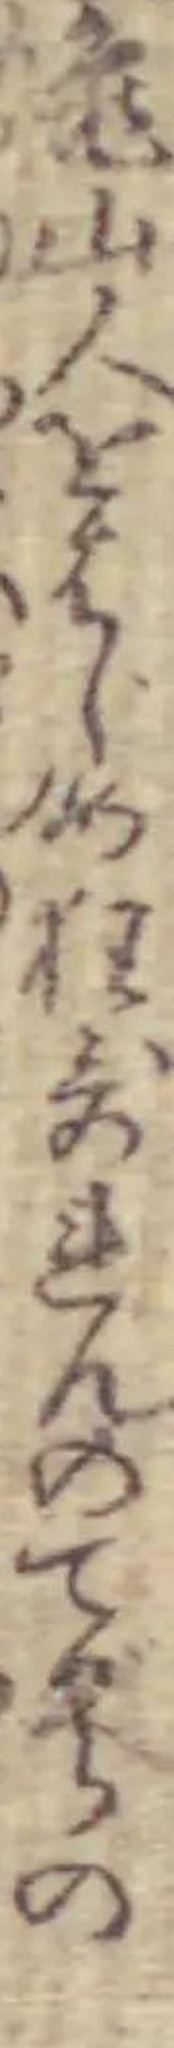亀山人をはじめ狂歌れんのてがらの
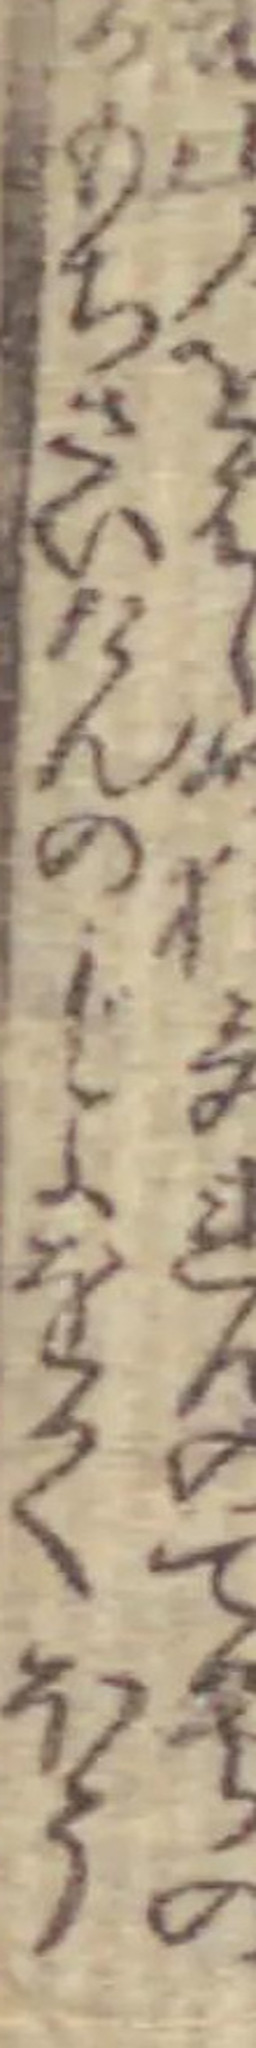おかもちさいけんのじよをかくほう
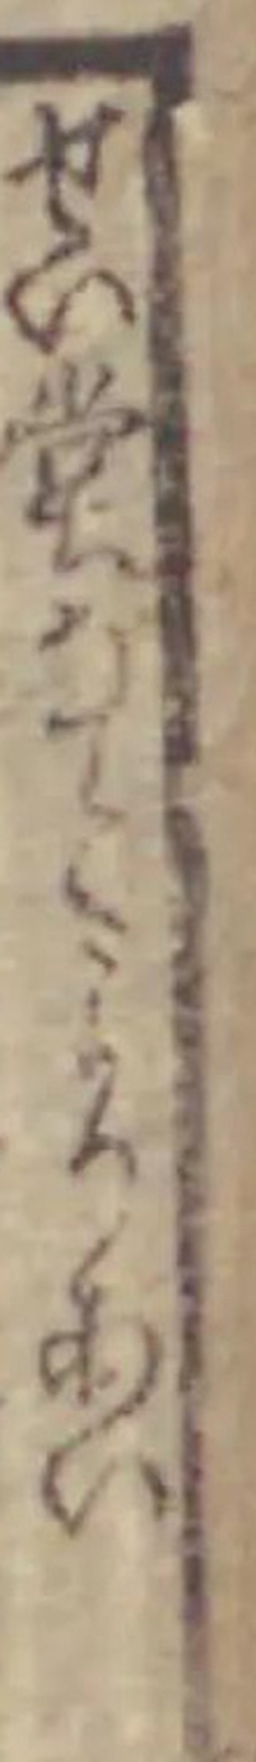せい堂なとよりあい
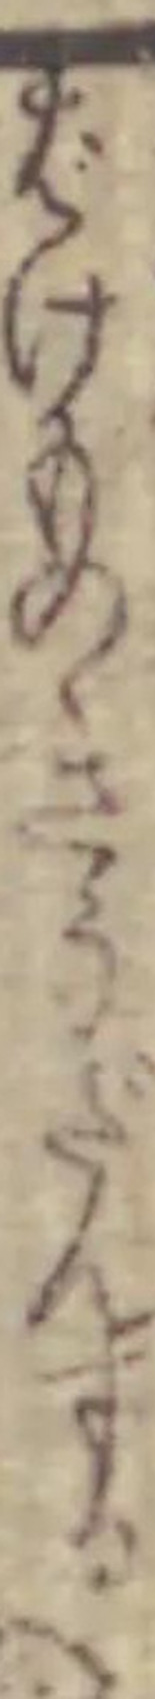ばけものゝさうだんする
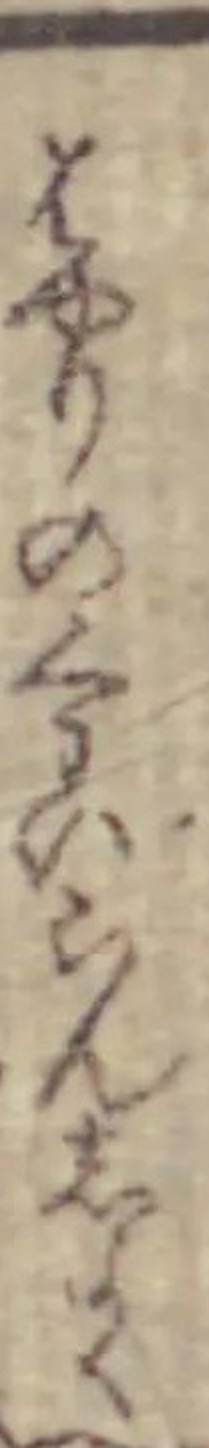はやりのくわいらんしよく
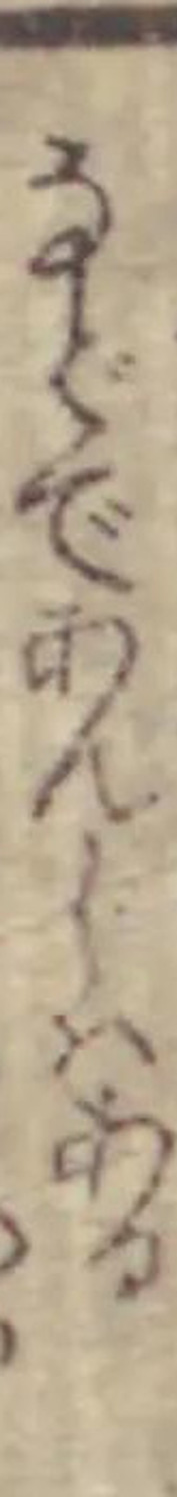などであんしはある
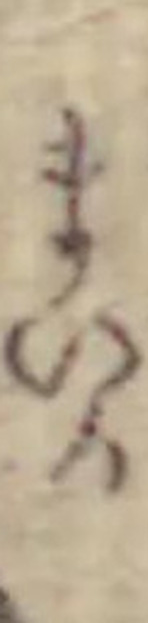まいか
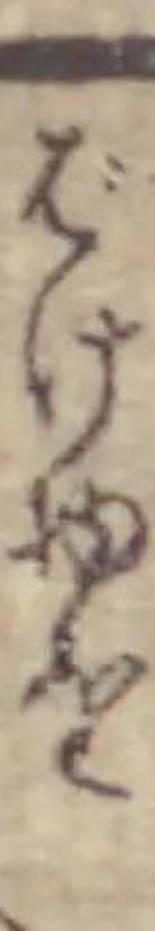ばけ物を
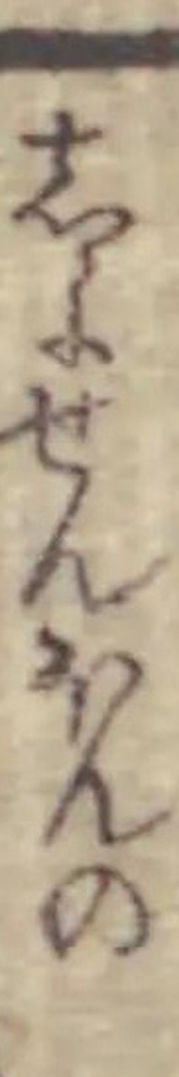しよせんほんの
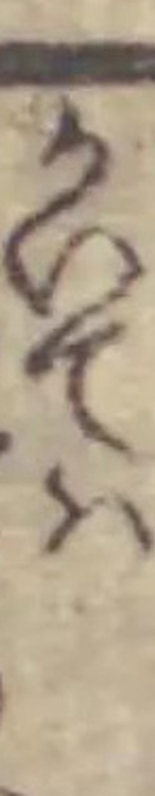かいては
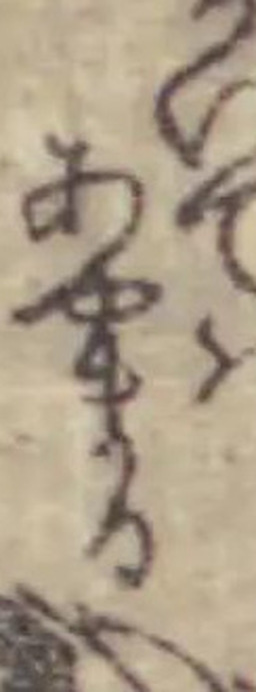あやまる
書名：亀山人家妖 3巻
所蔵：国立国会図書館 National Diet Library, JAPAN
